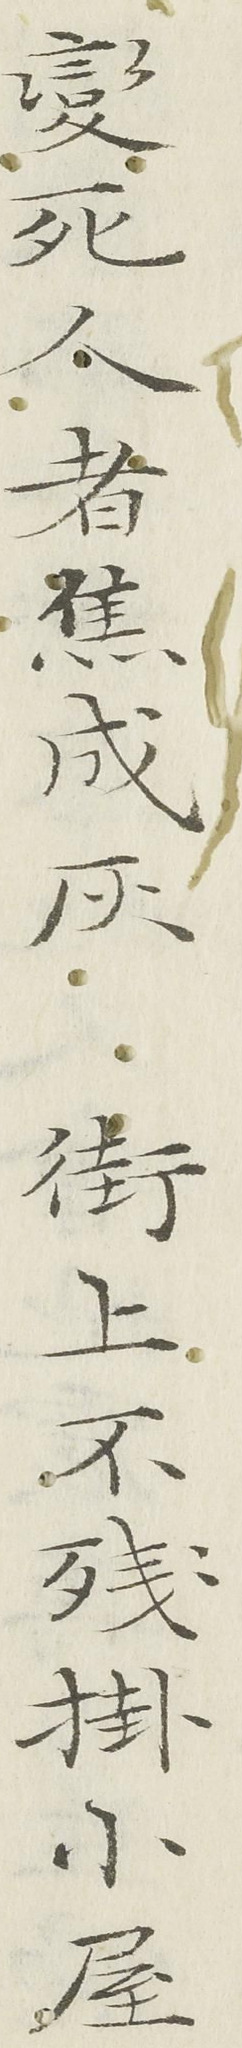変死人者焦成灰街上不残掛小屋
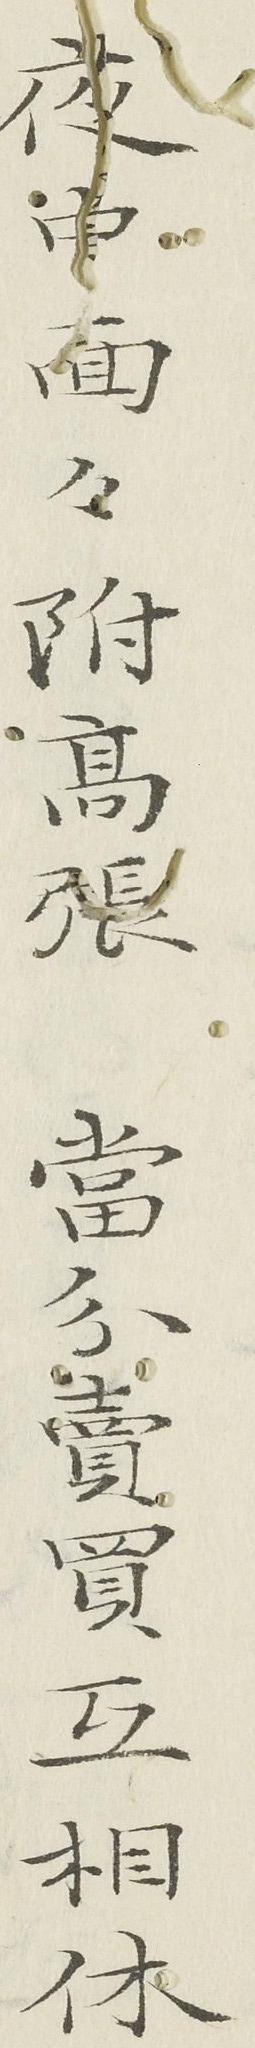夜中面々附高張当分売買互相休
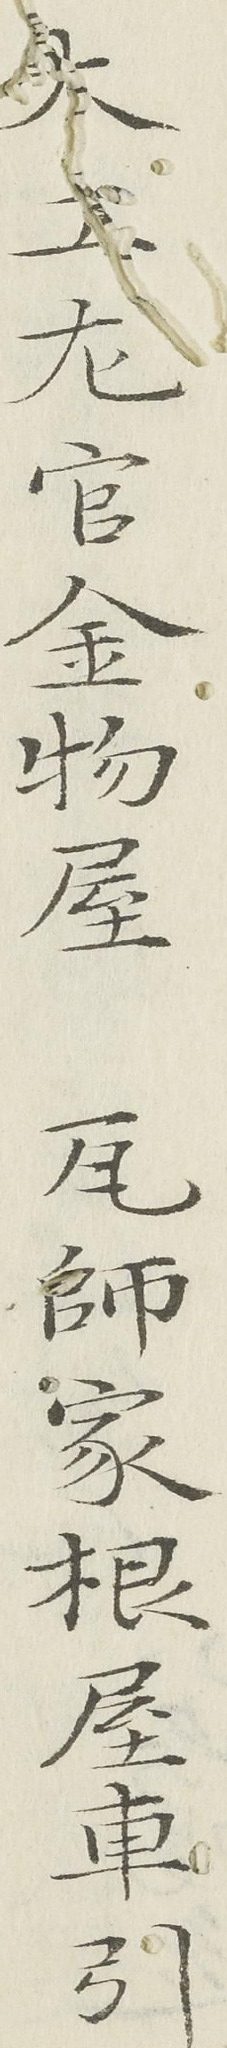大工左官金物屋瓦師家根屋車引
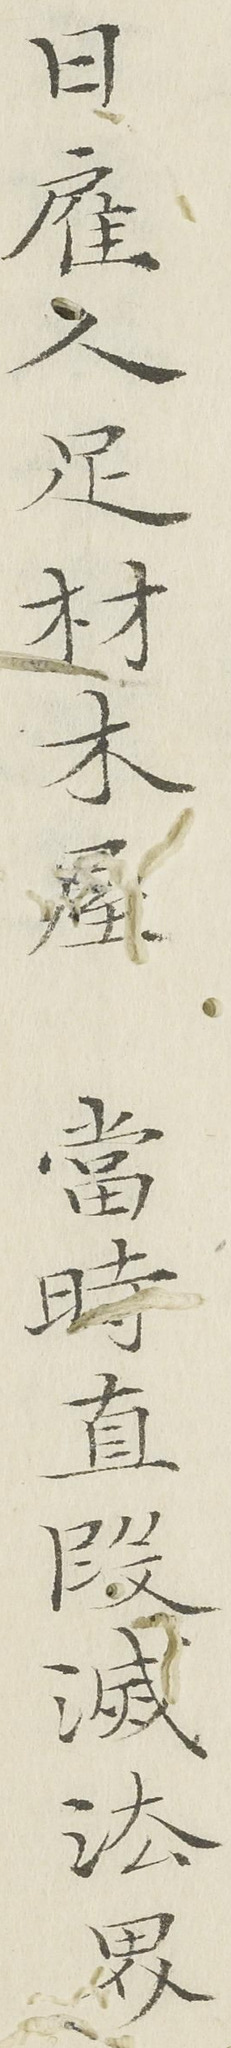日雇人足材木屋当時直段滅法界

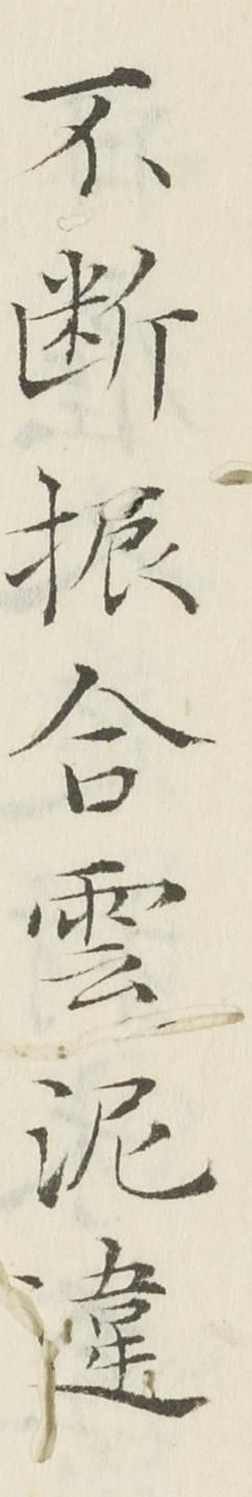不断振合雲泥違
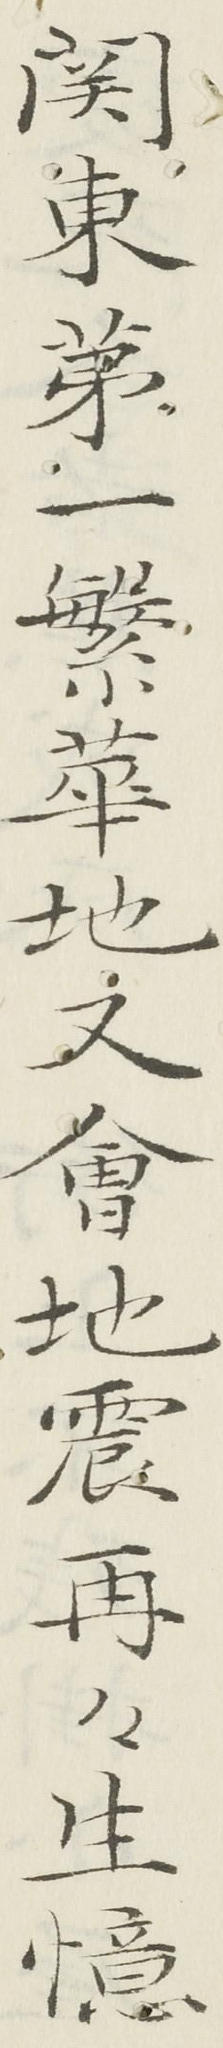関東第一繁華地又会地震再々生憶
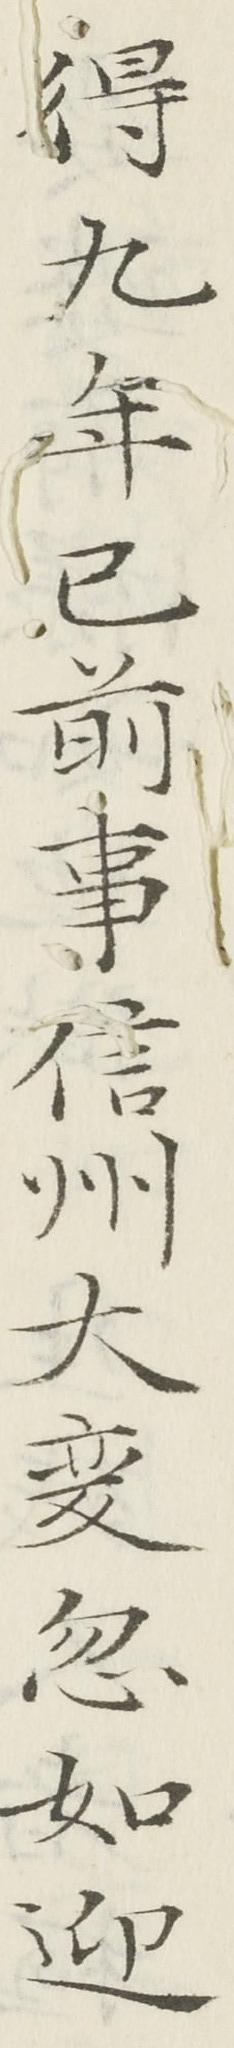得九年已前事信州大変忽如迎
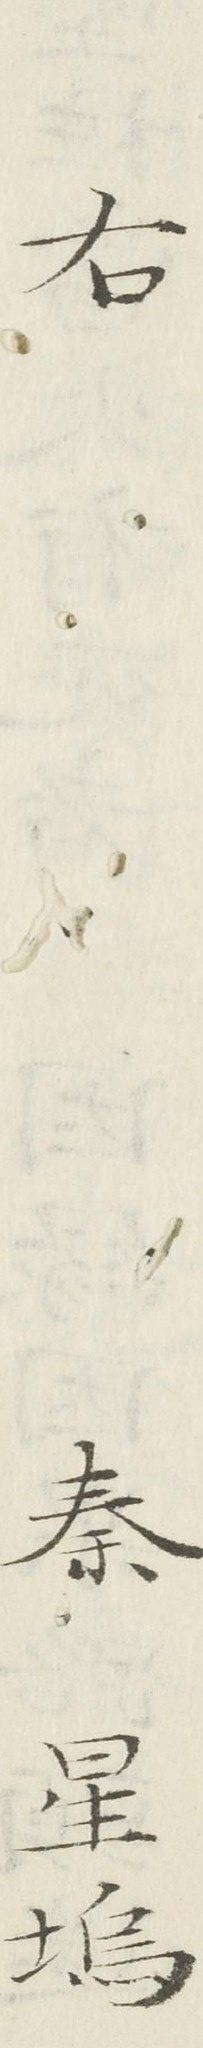右秦星塢
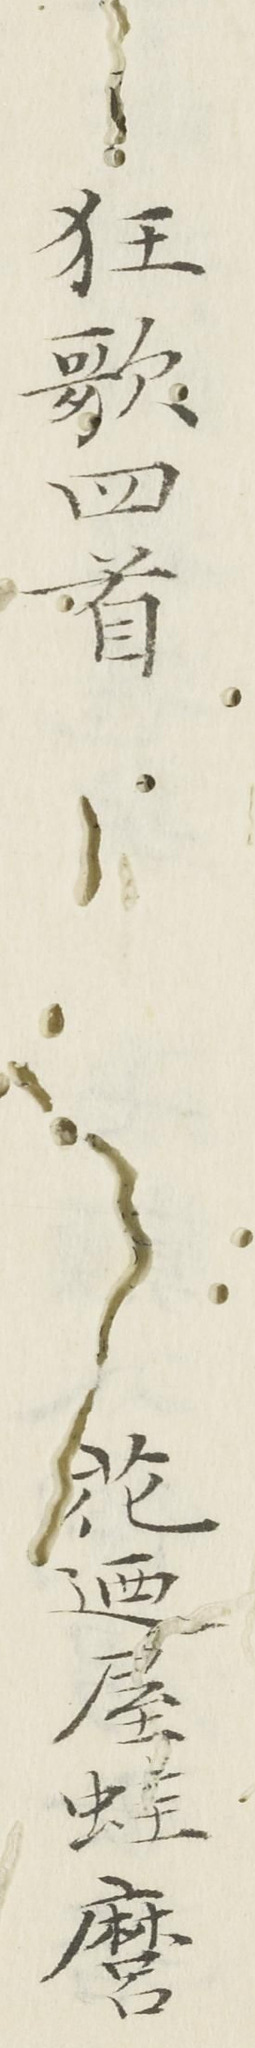狂歌四首花迺屋蛙麿
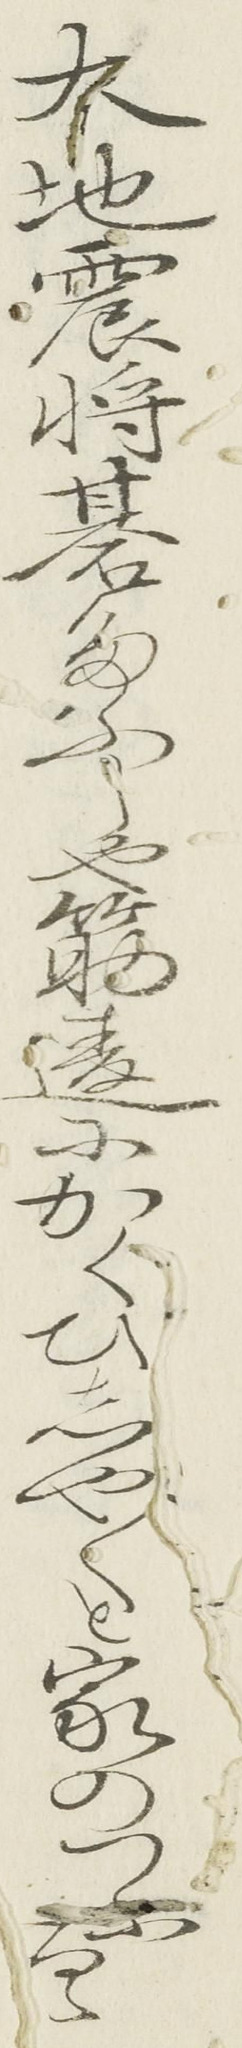大地震将碁雨ふりや筋違にかくひしや〳〵と家のつふるゝ
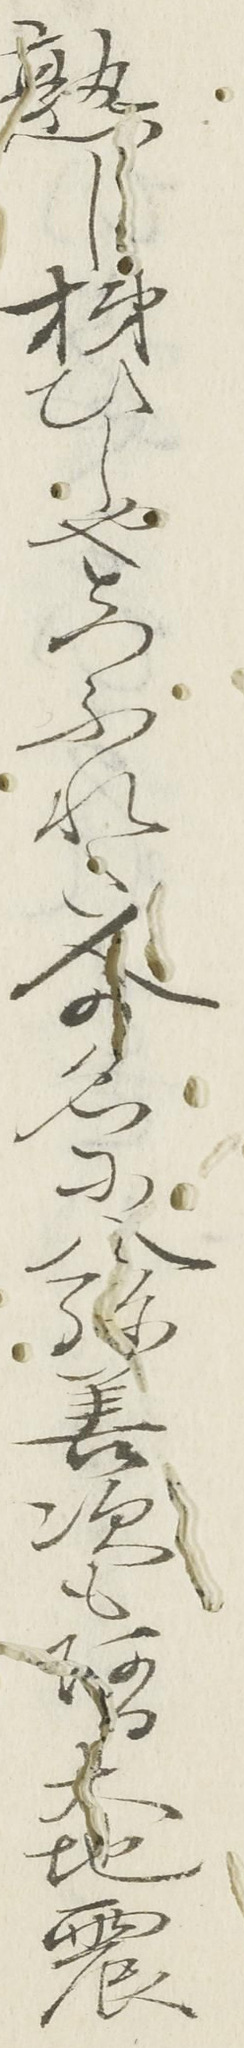熟し柿ひしやとつふれた人の名に八珍善次もある大地震
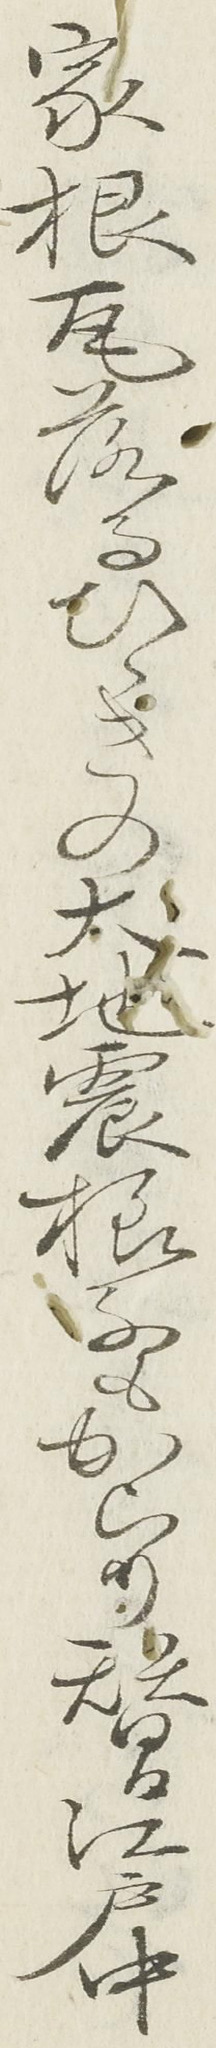家根瓦落るひゝきの大地震様子もからり替る江戸中
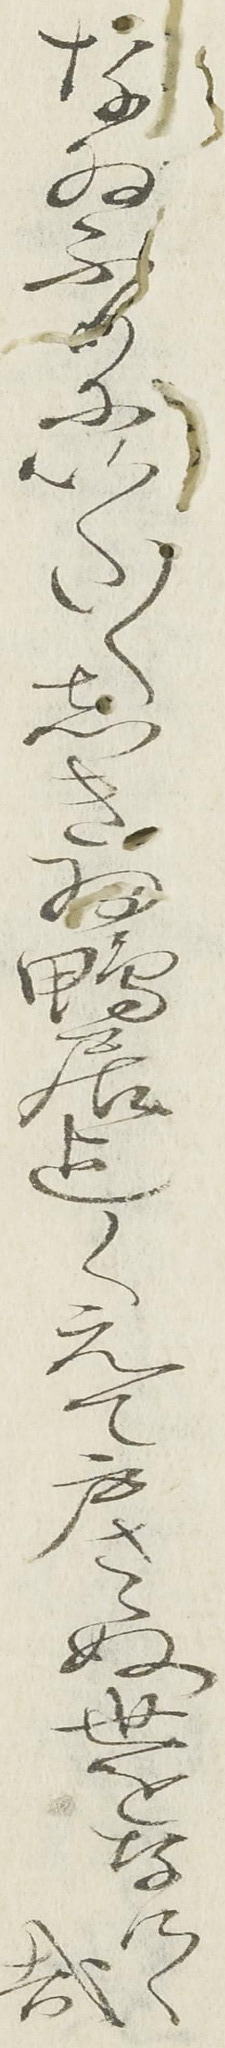なゐふりにいた〳〵しきゐ鴨居迄〳〵えて戸さらぬ世をなけく哉
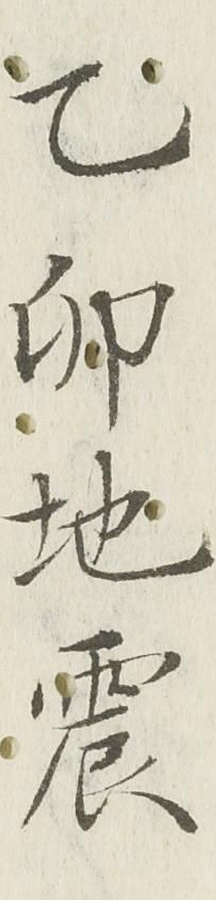乙卯地震
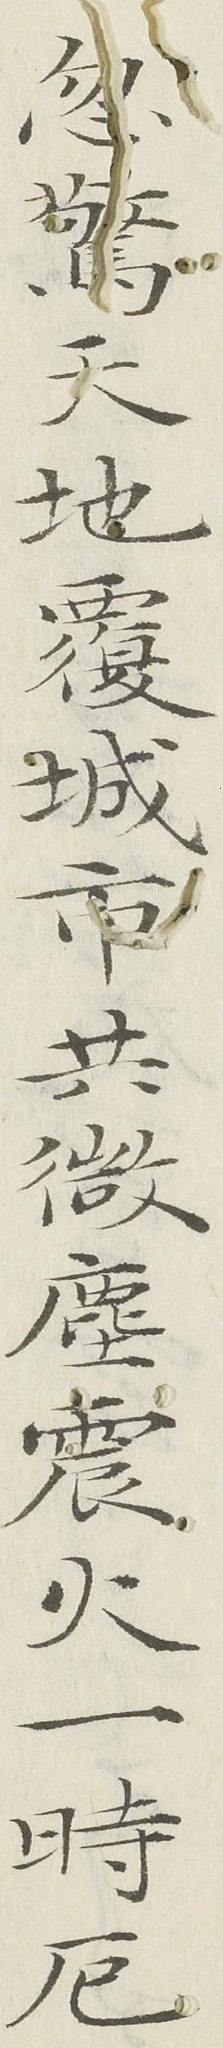忽驚天地覆城市共微塵震火一時厄
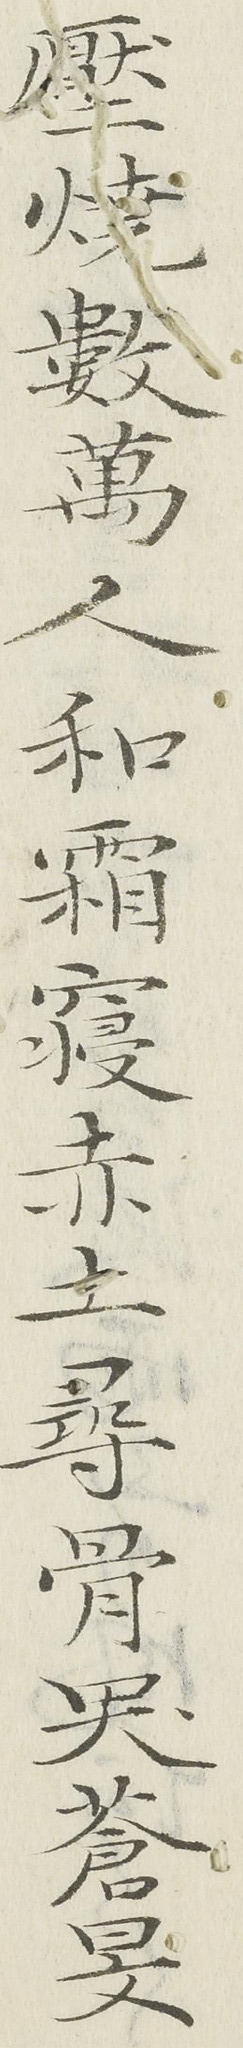圧焼数万人和霜寝赤土尋骨哭蒼旻
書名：地震考證　全
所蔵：東京大学地震研究所図書室 Earthquake Research Institute Library, The University of Tokyo, JAPAN
